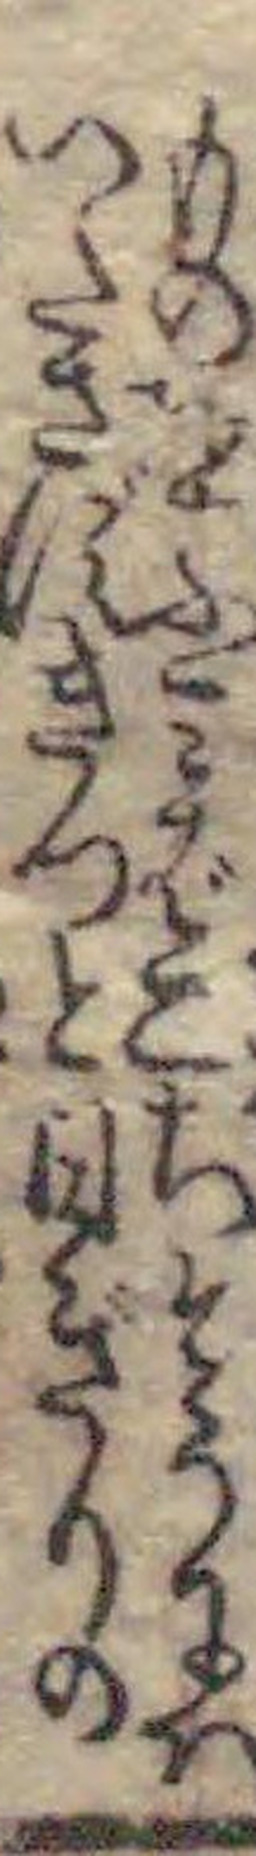いたさずきつと日ぎりの
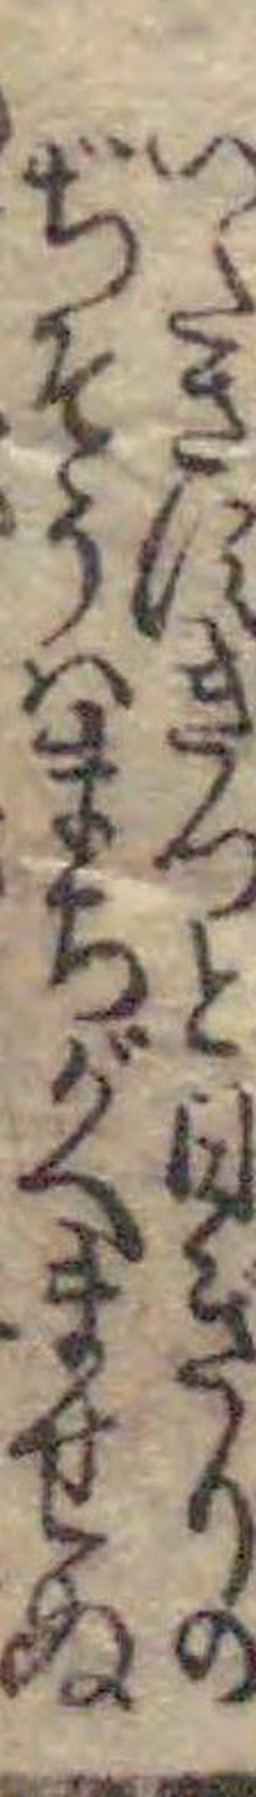ぢそうはまちがへませぬ
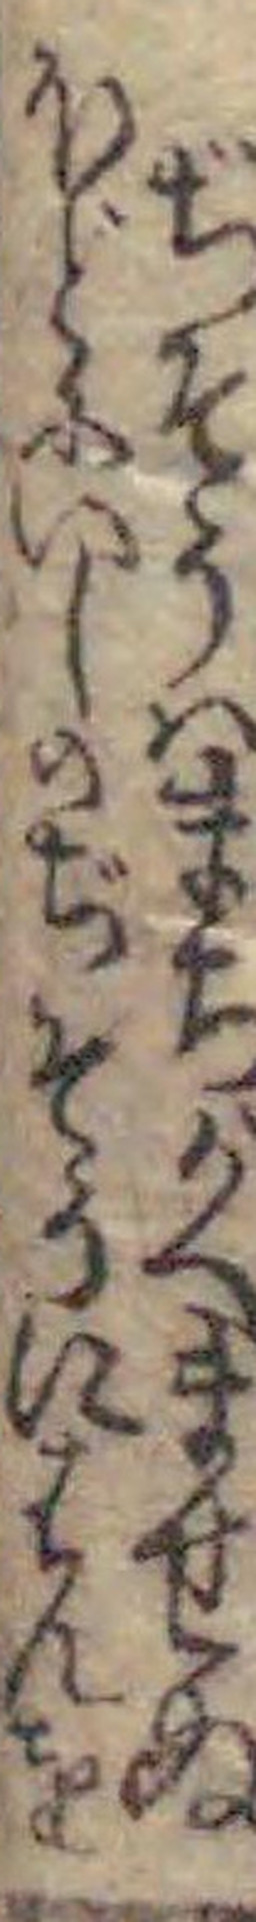ほどにいしのぢそうにはんを
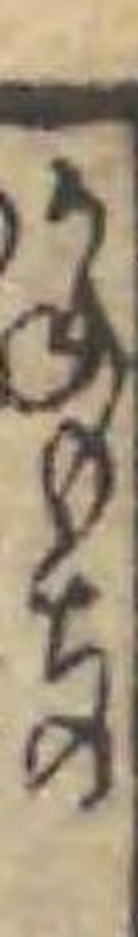かねもちの
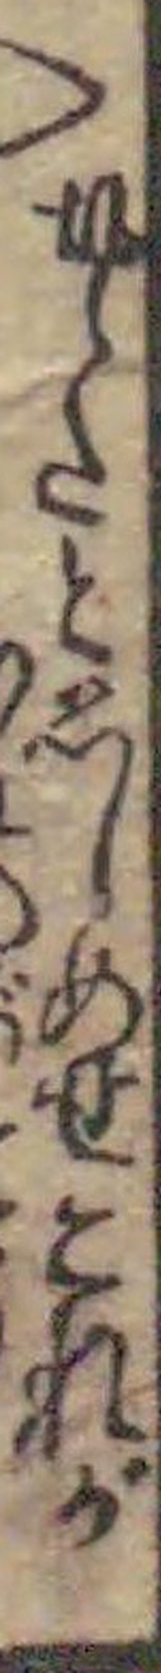おしたと思しめせこれが
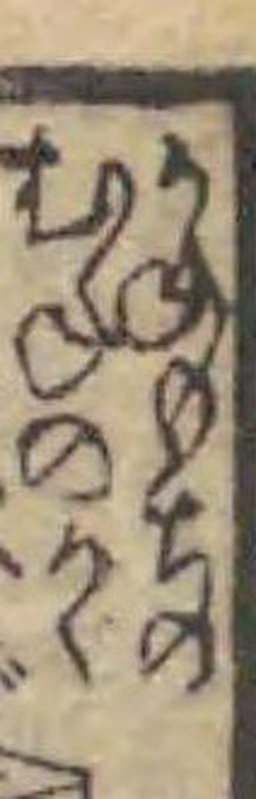むねのかゞ
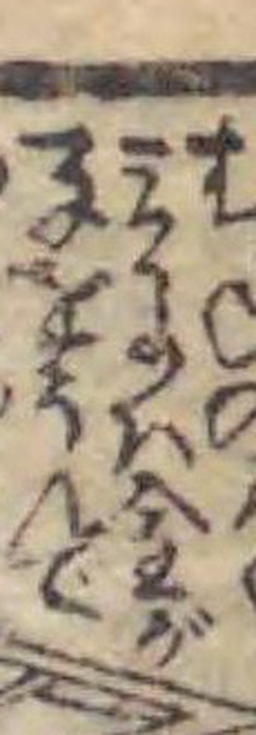子をうんで
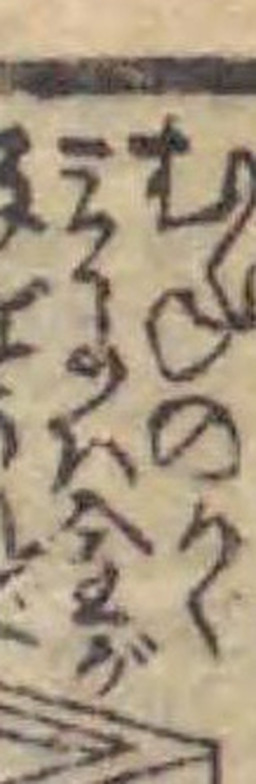みには金が
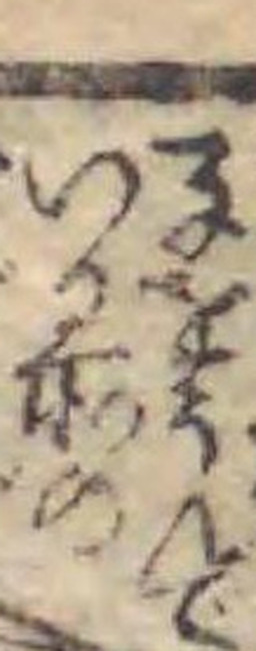いる所の
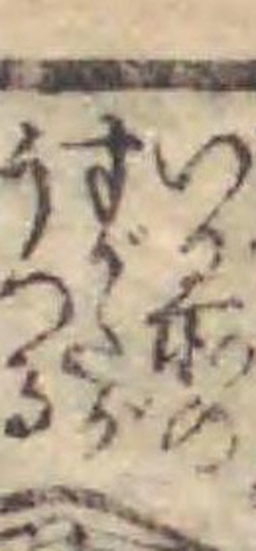すがたが
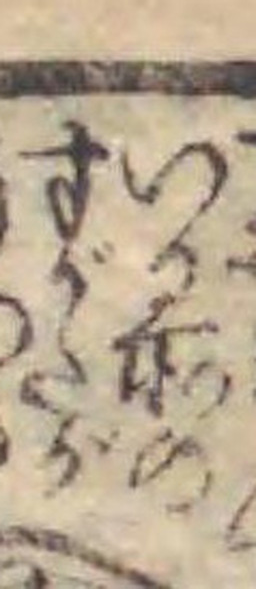すがたが
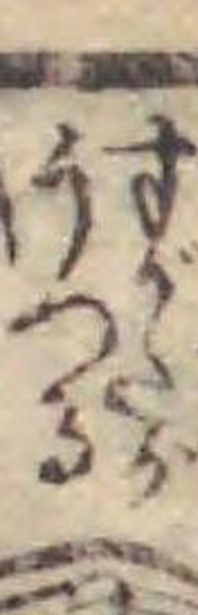うつる
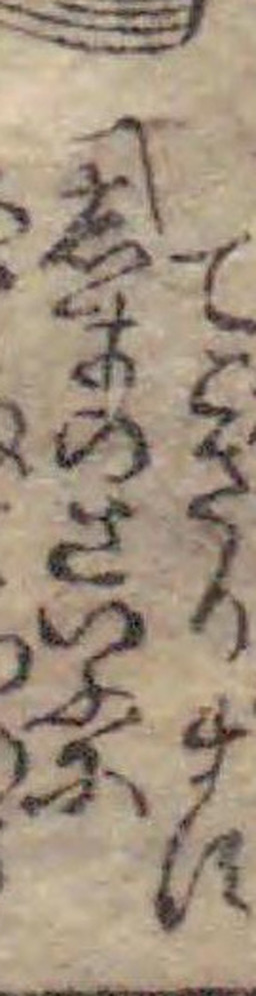〽しまのさいふに
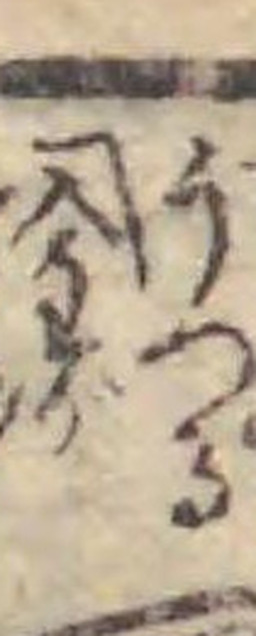〽金が
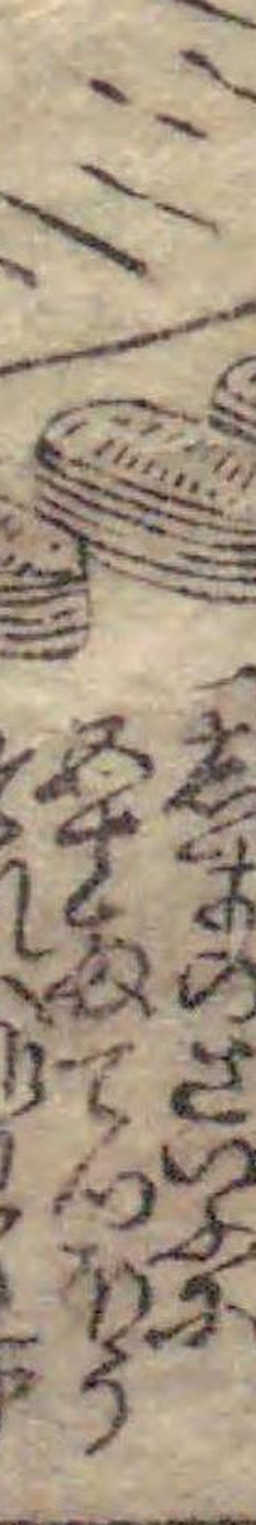五十両てつほう
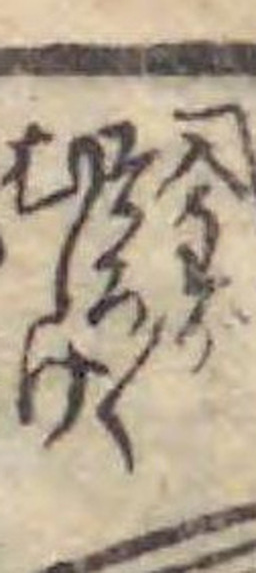むしけ
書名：人心鏡写絵 : 3巻
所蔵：国立国会図書館 National Diet Library, JAPAN
